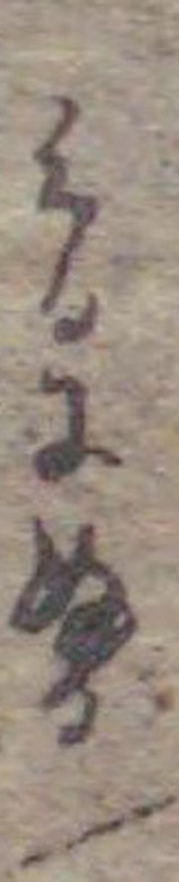みゝにぬる
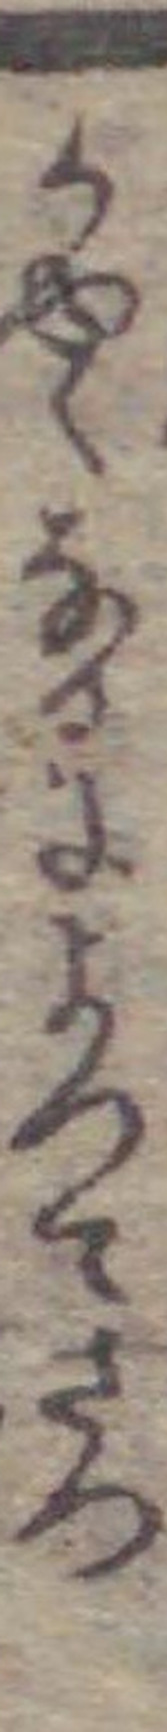かやくなるによつてさつ
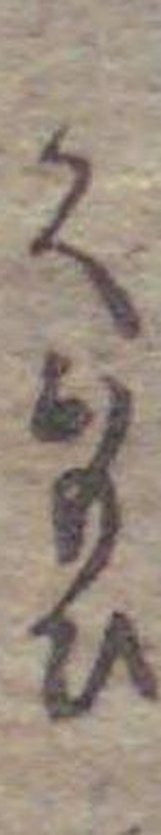かへおもひ
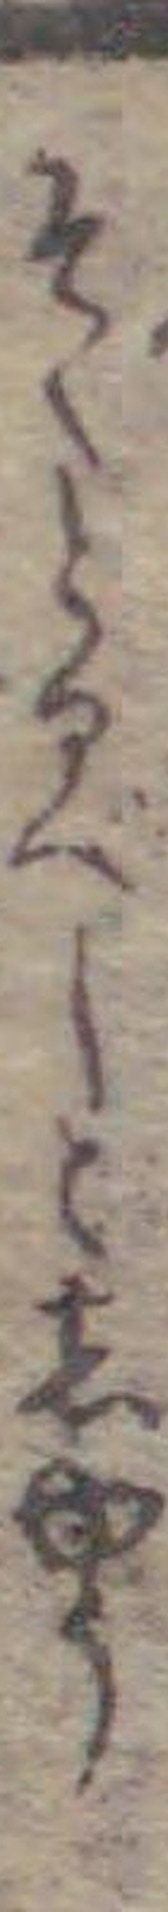そくとるべしとしゆう
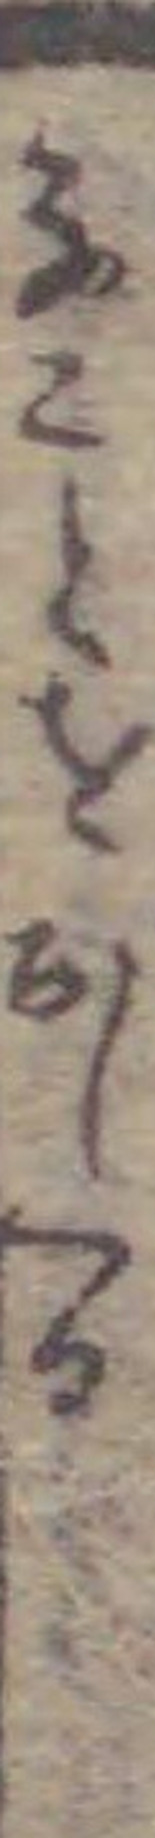なことををおしへる
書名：五躰不具毒解薬 : 3巻
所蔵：国立国会図書館 National Diet Library, JAPAN
